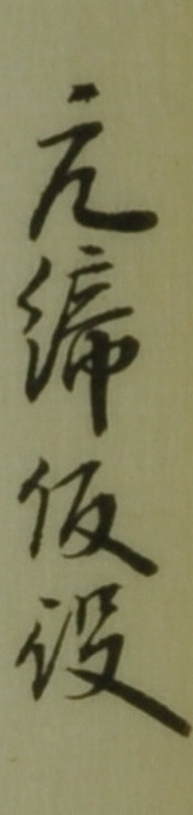元締仮役
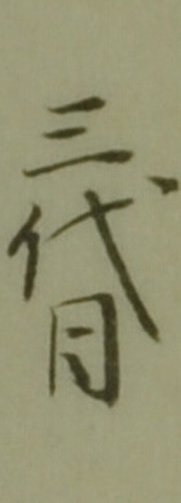三代目
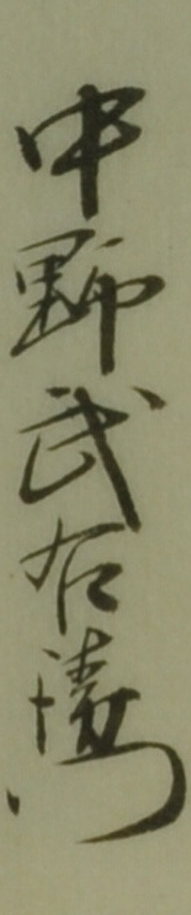中野武右衛門
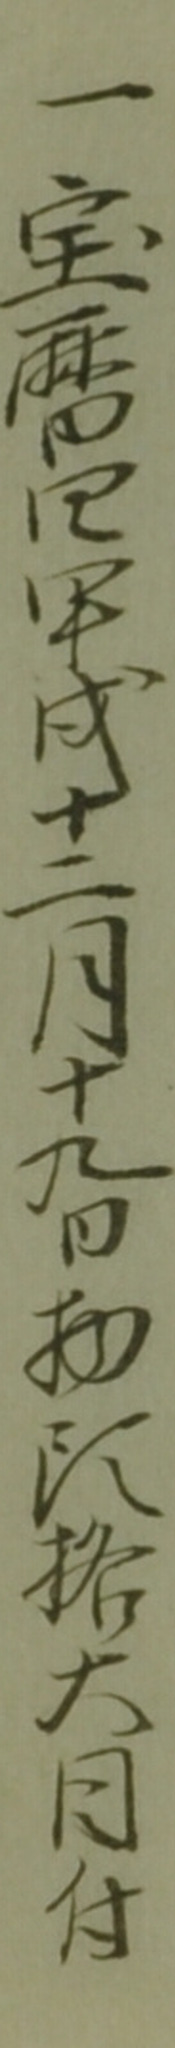一宝暦四甲戌十二月十九日物頭格大目付
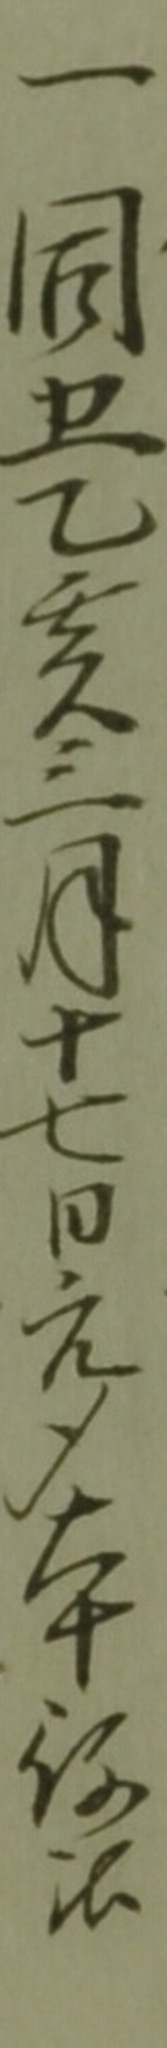一同五乙亥三月十七日元〆本役被
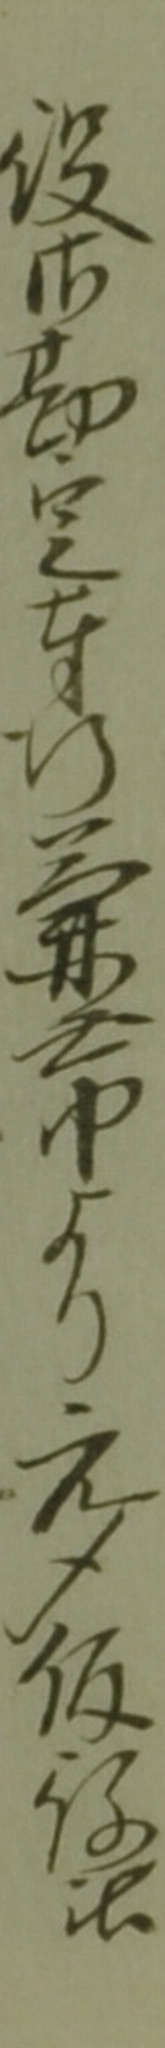役御勘定奉行兼帯より元〆仮役被
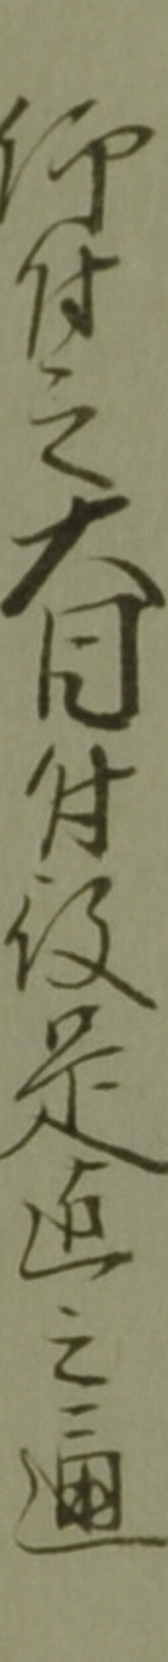仰付之大目付役是迄之通
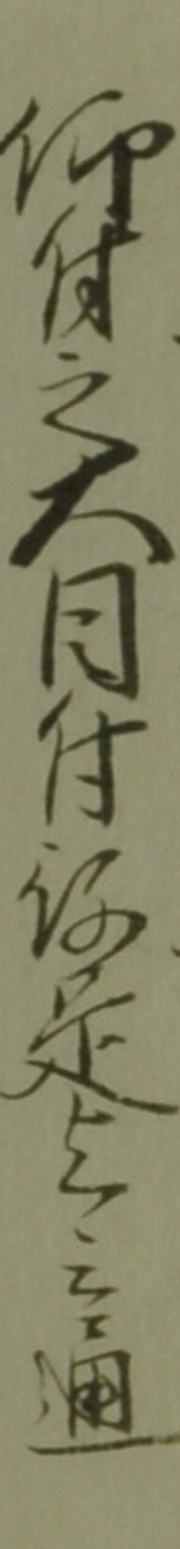仰付之大目付役是迄之通
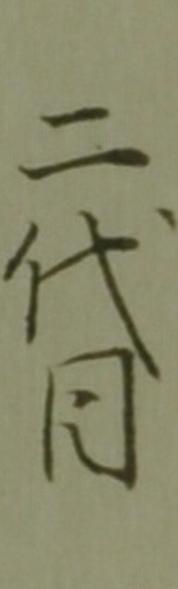二代目
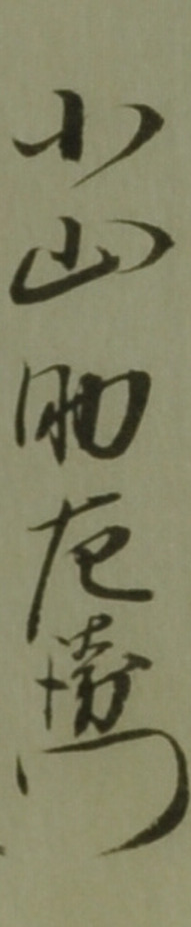小山助左衛門
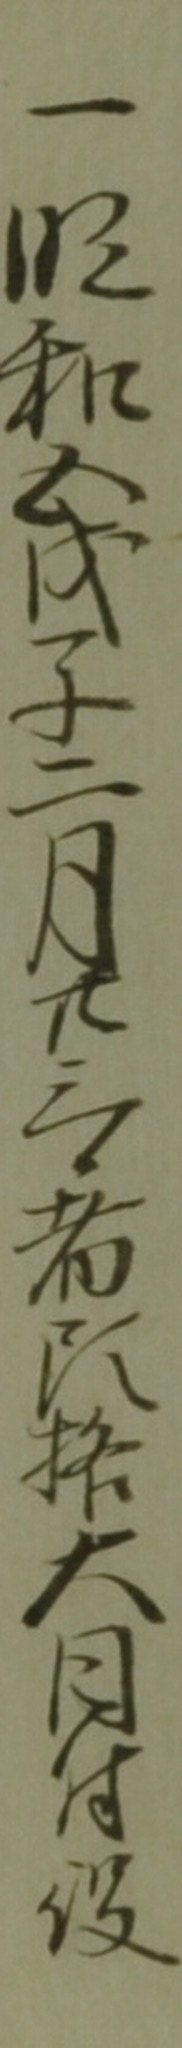一明和五戊子二月廿三日者頭格大目付役
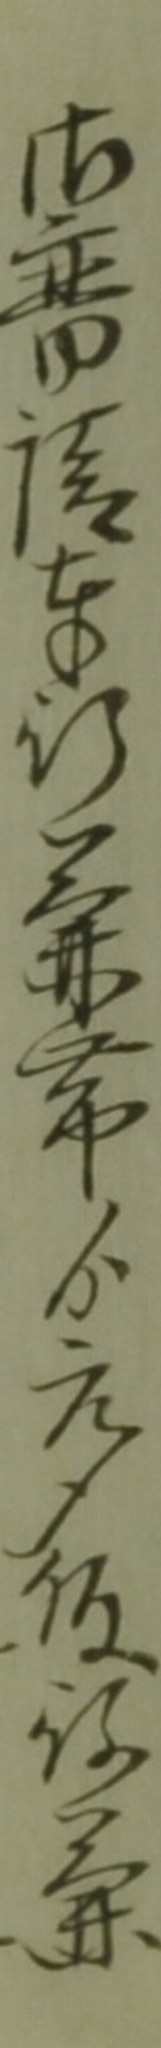御普請奉行兼帯ゟ元〆仮役兼
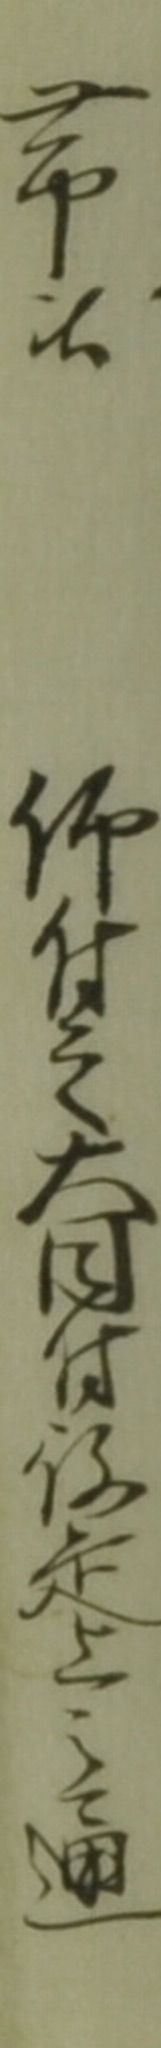帯被仰付之大目付役是迄之通
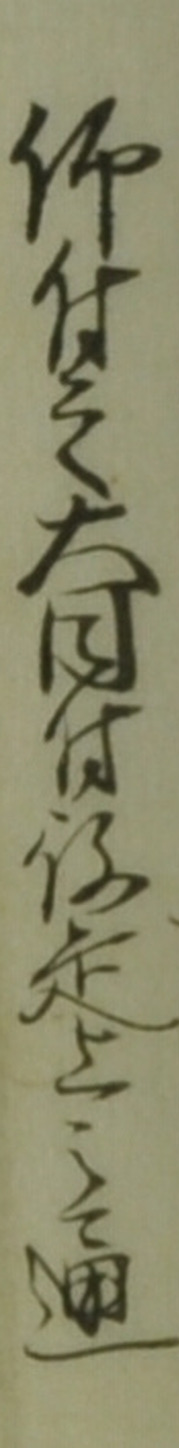仰付之大目付役是迄之通
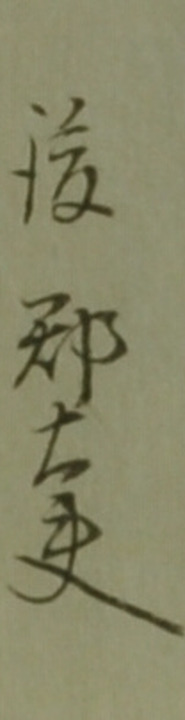後郡太夫

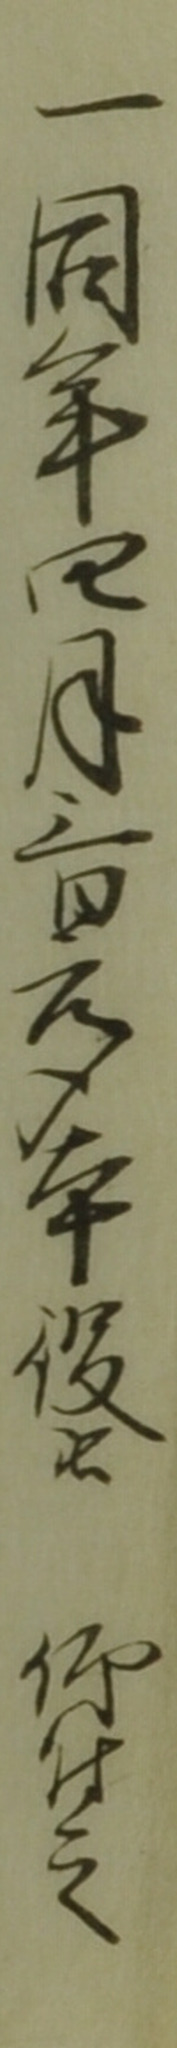一同年四月三日元〆本役被仰付之
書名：諸御役代々録（七）
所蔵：伊那市立高遠町図書館・合同会社AMANE
